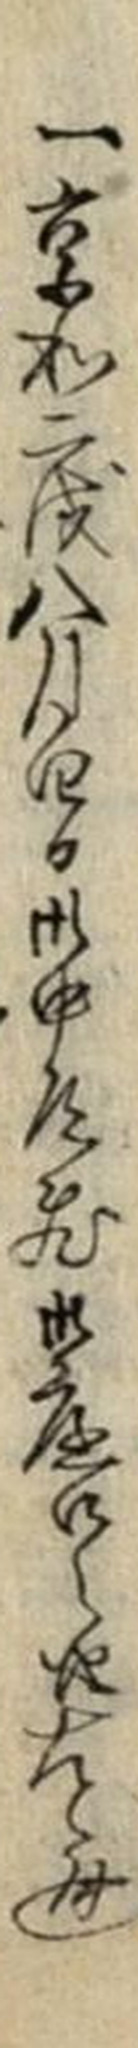一享和度二戌八月四日御中屋敷御庭口之儀左之通
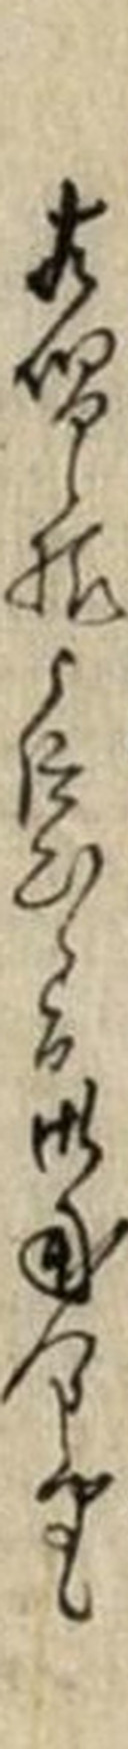相唱候様被仰出候間御用人申聞候
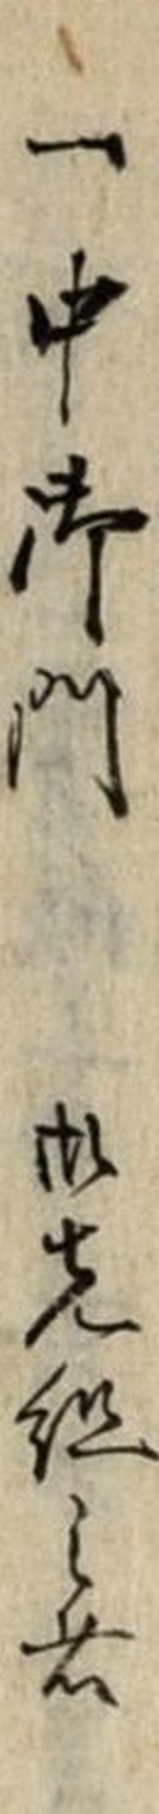一中御門御先組之者
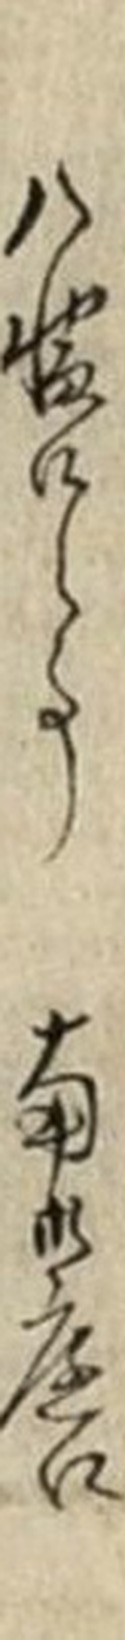八幡口之事南御庭口
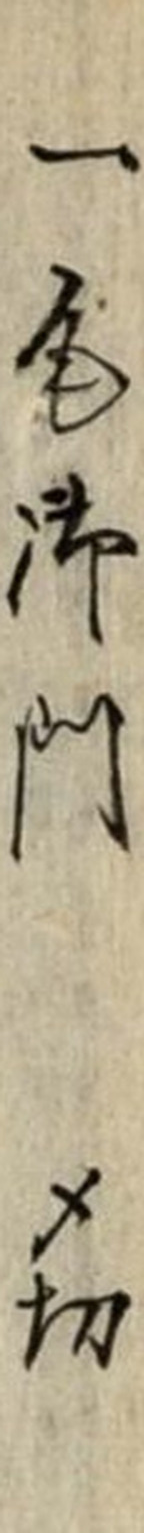一瓦御門〆切
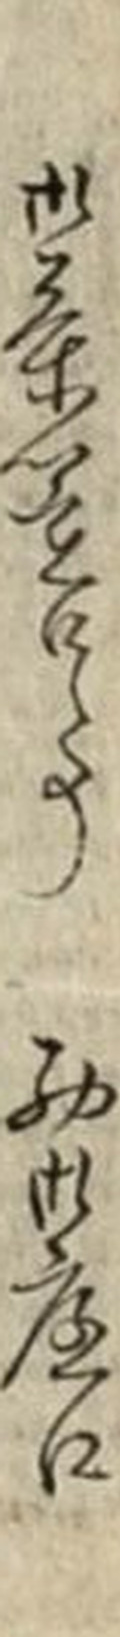御茶釜口之事西御庭口
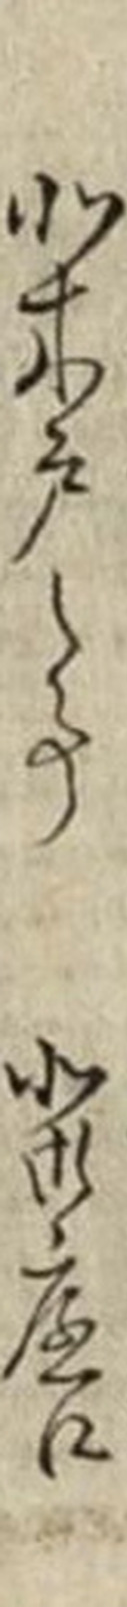北木戸之事北御庭口
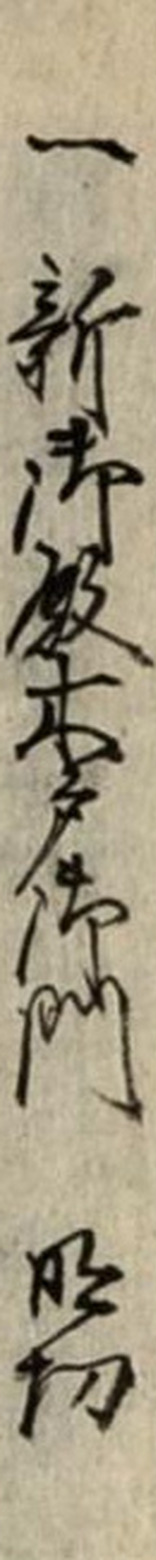一新御殿木戸御門明切
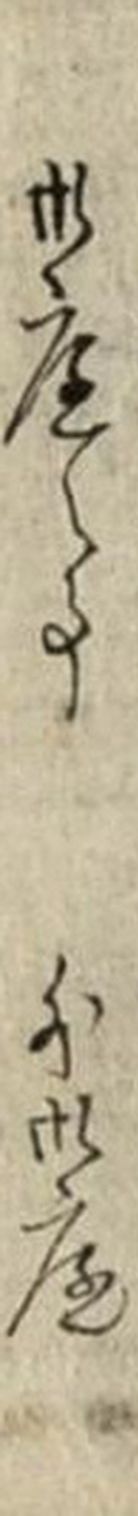御庭之事外御庭
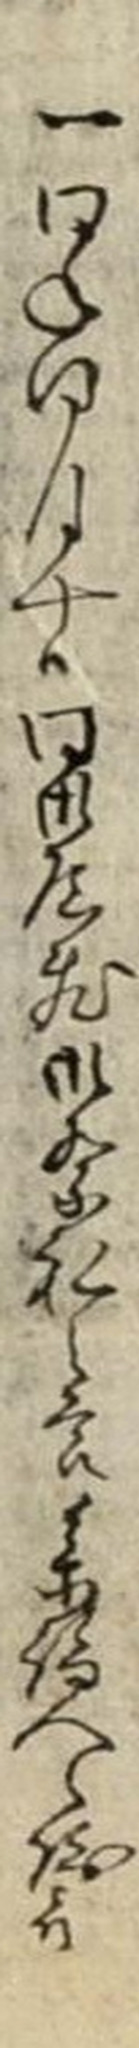一同年同月十日同御屋敷御祭祀之節参詣人之儀に付
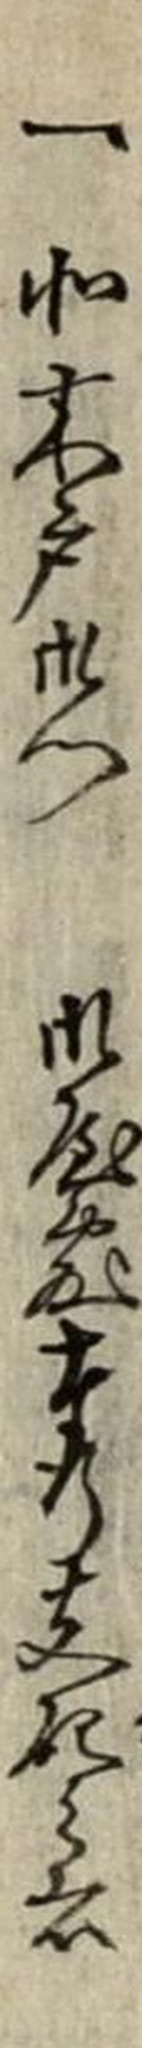一北木戸御門御屋敷奉行支配之者
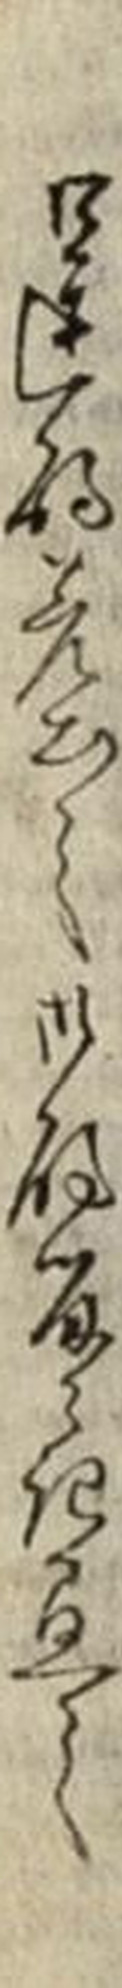口達触差出之御触留に記置之
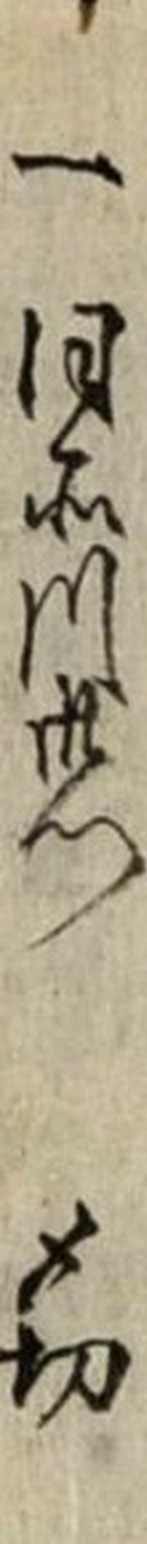一同所川御門〆切
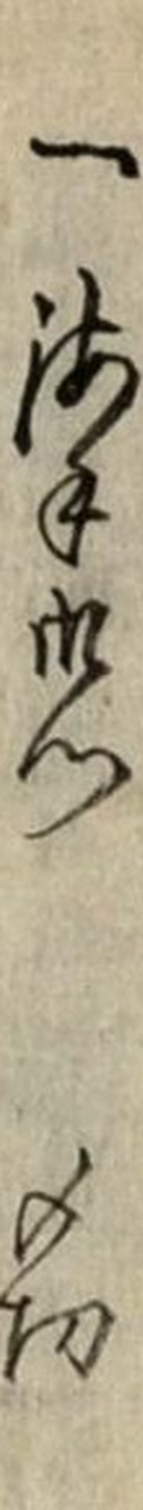一海手御門〆切
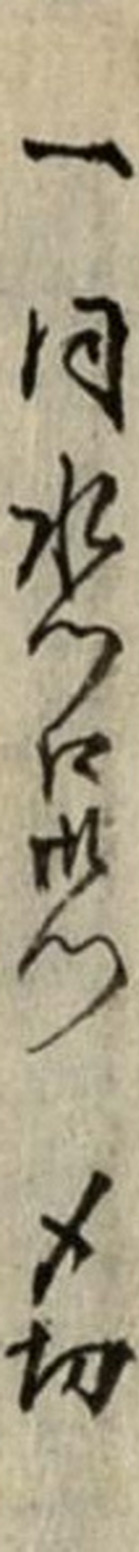一同水門口御門〆切
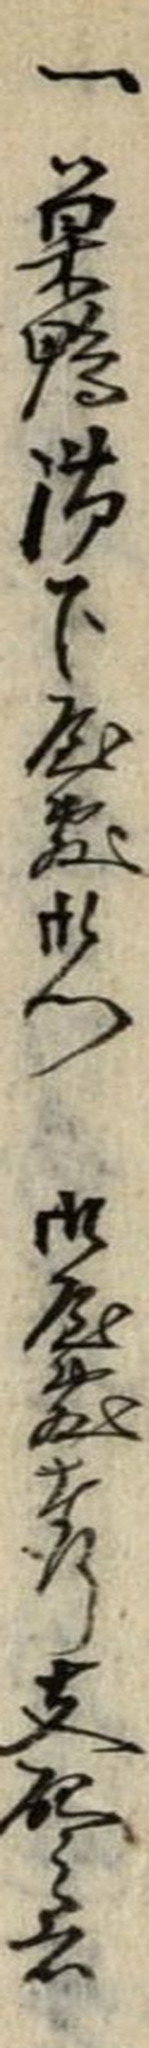一巣鴨御下屋敷御門御屋敷奉行支配之者
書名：三都并道中之部
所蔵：福井県文書館 Fukui Prefectural Archives
